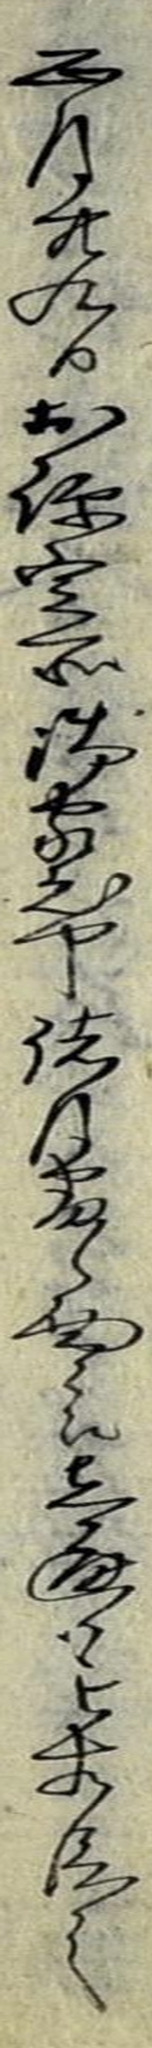正月廿九日於評定所御家老中諸月番之面々江壱通ツヽ被相渡之
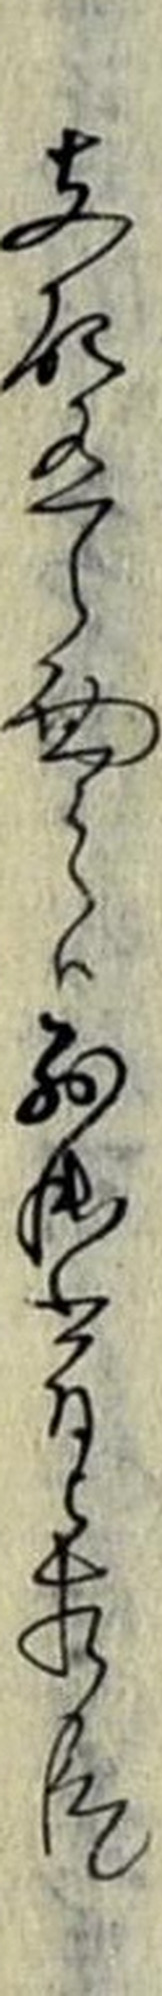支配有之面々ヘハ別紙書付被相渡候
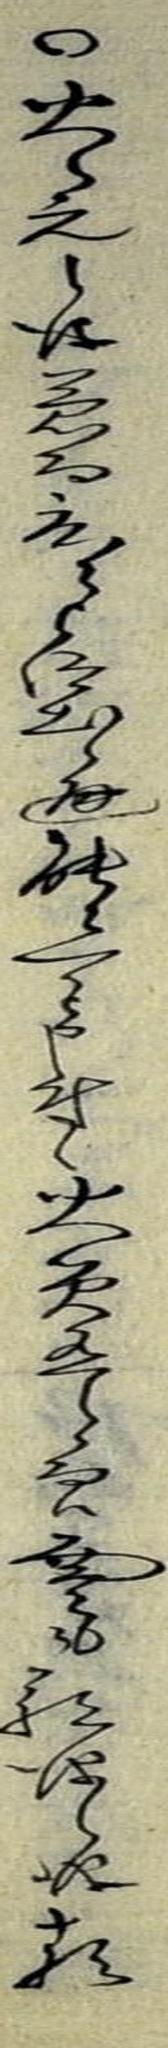〇火之元之儀兼而度々被仰出候通能々可被申付候火災有之候而ハ面々も難儀之儀類
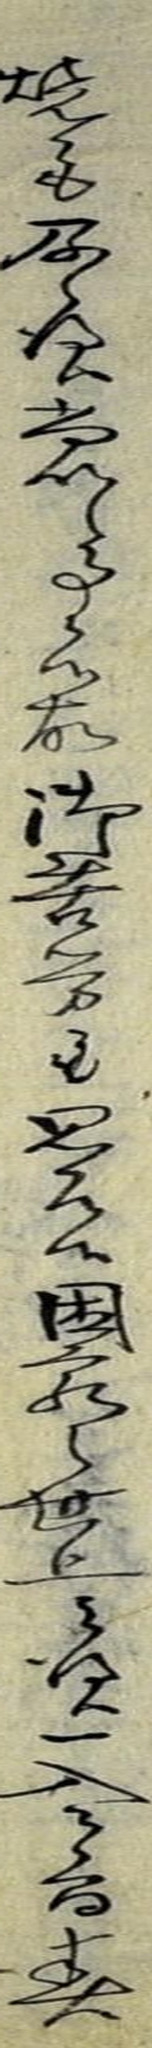焼ニも及候得ハ尚以之事ニ候故御苦労ニも思召候困窮之世上ニ候得ハ一入ニ候間春
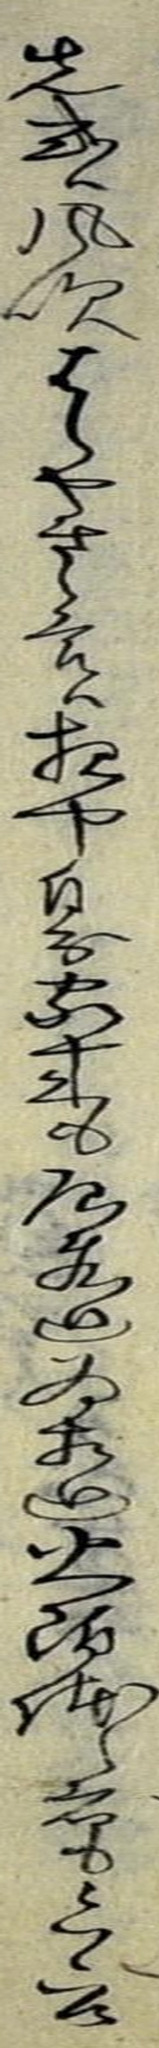先或ハ風吹はしやき候節ハ夜中自分家来も屋敷廻為相廻火附体之者も候ハヽ召
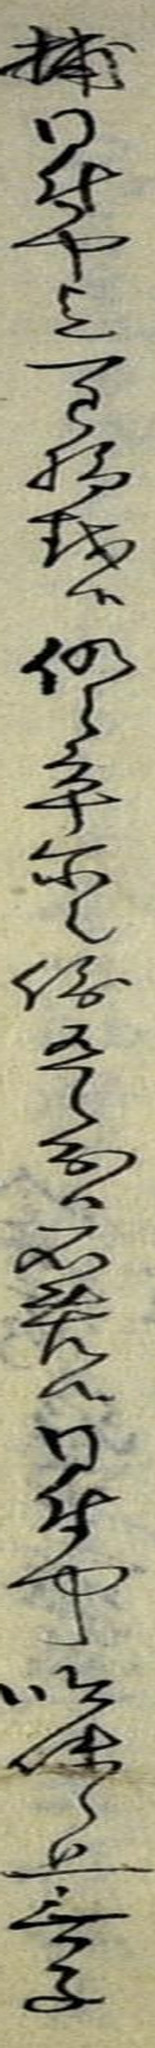捕目付中迄可被指越候仍之卒爾之儀有之分ハ不苦候目付中吟味之上無子
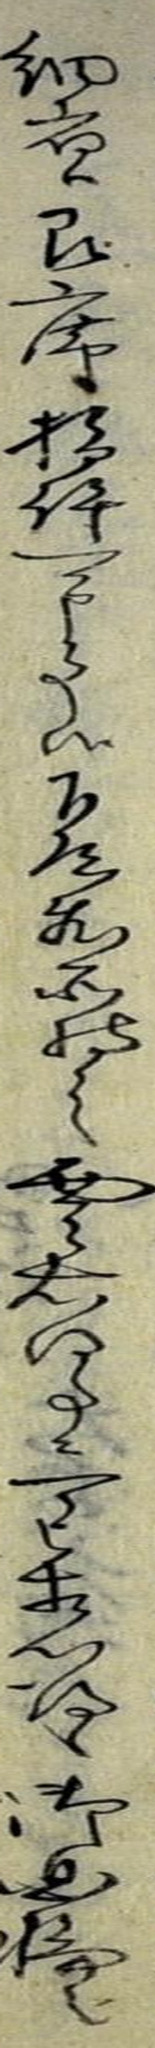細者ハ即席指許可申事候下屋敷所持之面々右同事ニ可被相心得候御曲輪之
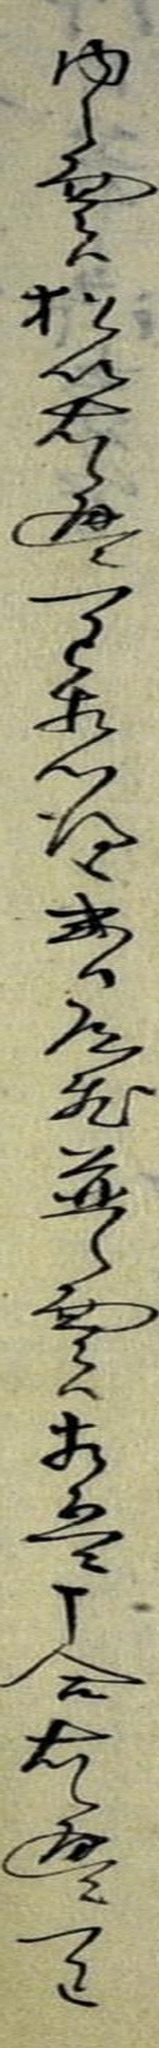内之面々ハ猶以右之通ニ可被相心得候或ハ屋敷並之面々ハ相互ニ申合右之通ニ可被
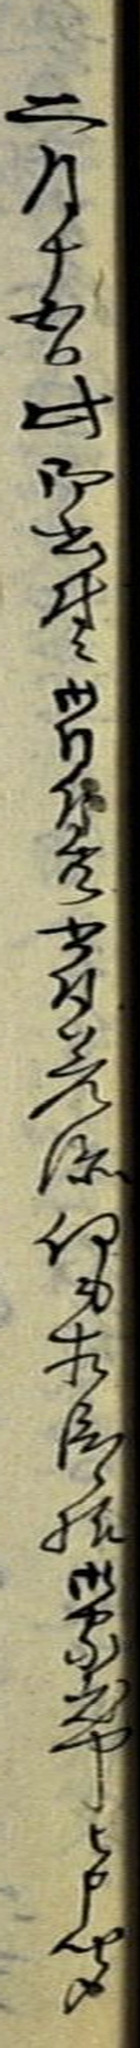二月十五日此書付ニ御目付共書付差添何も相渡候様御家老中被申聞
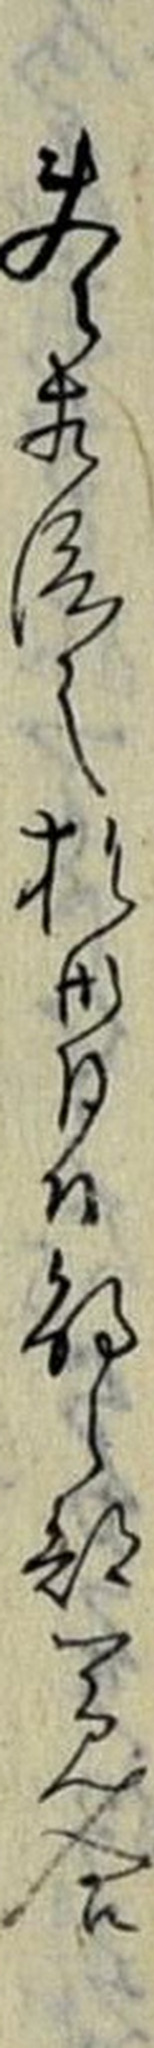夫々相渡之猶御目付触之部可見合
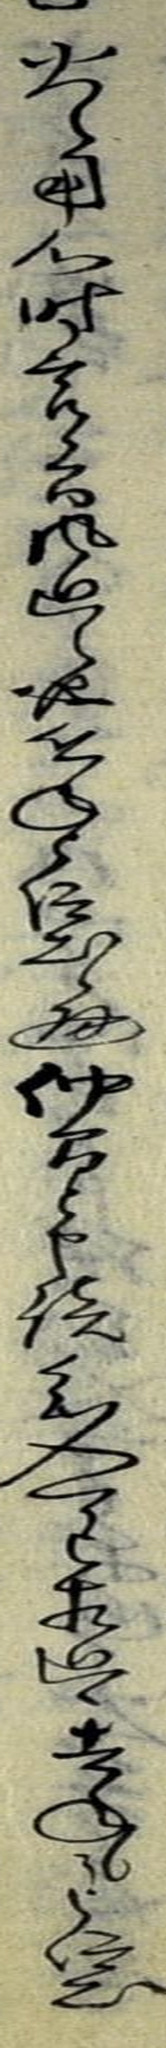〇火之用心時節候間風廻之儀近年被仰出候通仲間と申談念入可被相廻候去年も被仰出
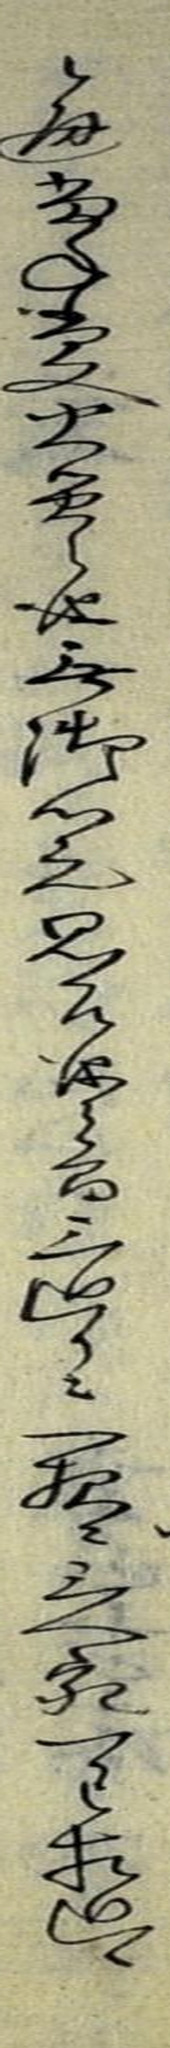候通当年尚又火災之儀無御心元思召儀ニ候間三廻りニ一夜ニ三人宛可被相廻候
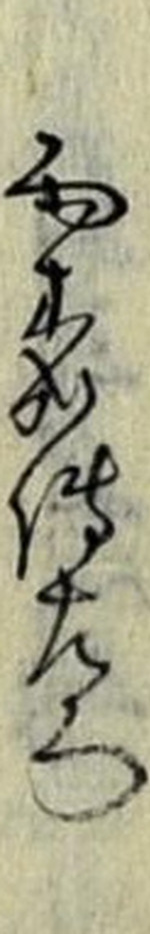覚雨森伝左衛門
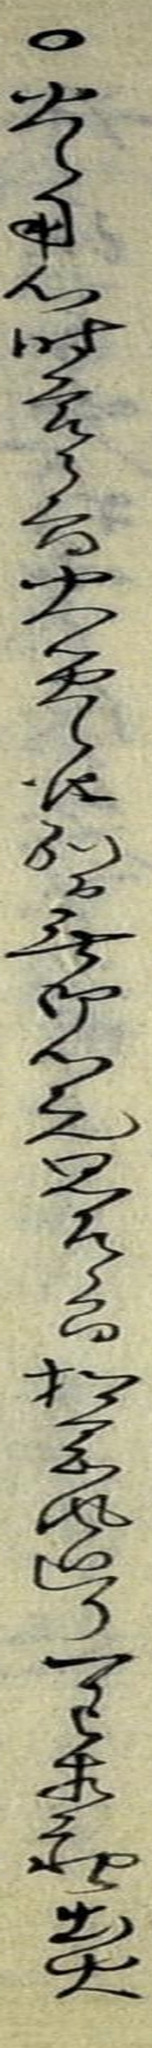〇火之用心時節ニ候間火災之儀別而無御心元思召候間松岡風廻り可被相勤候出火
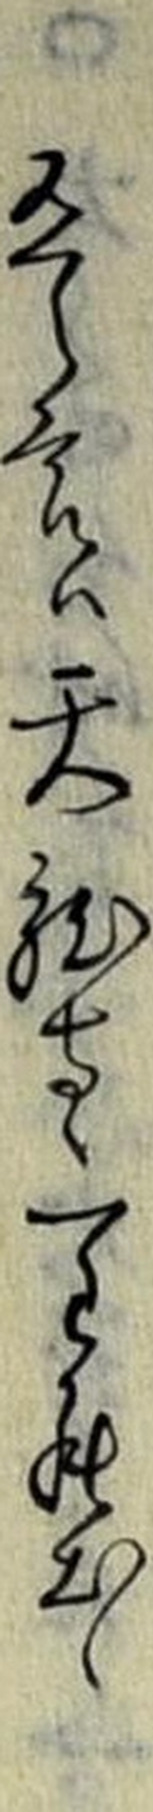有之節ハ天徳寺へ可被罷出候
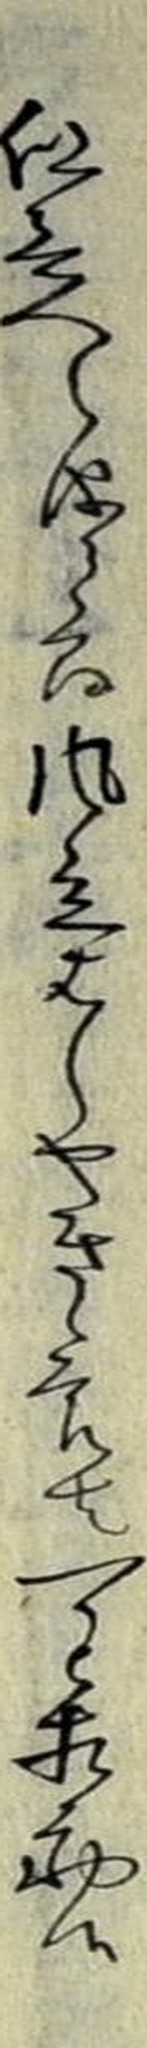但壱人之儀ニ候間風立はしやき候節者可被相勤候
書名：命令之部 一
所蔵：福井県文書館 Fukui Prefectural Archives
